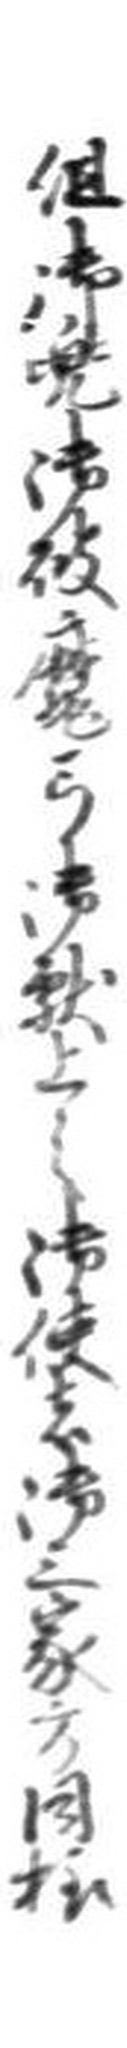但御兜御破魔弓御献上之御使者御三家方同様
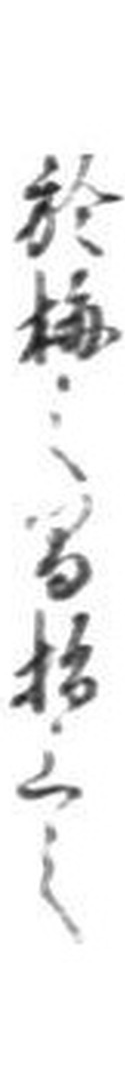於梅之間指上之
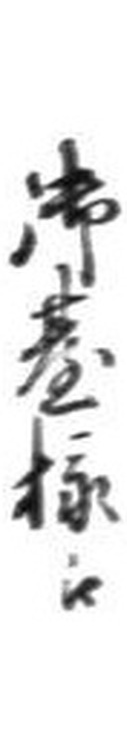御台様江

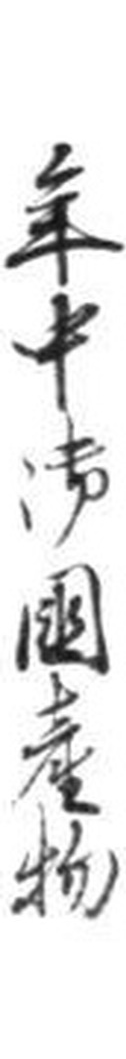年中御国産物
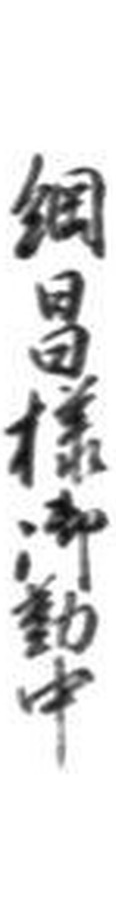綱昌様御勤中
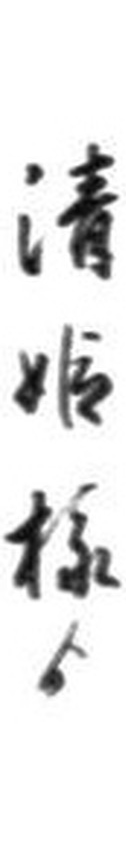清姫様ゟ
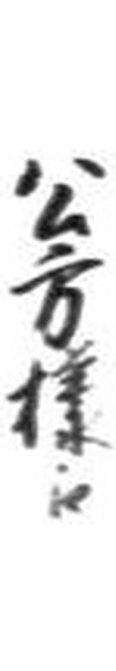公方様江
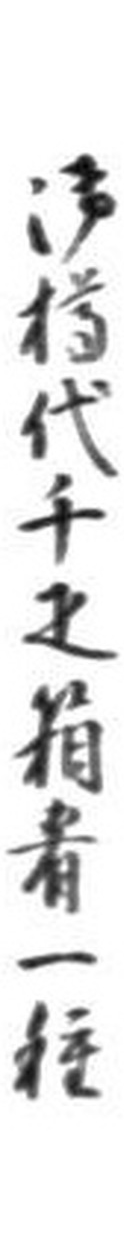年頭御樽代千疋箱肴一種
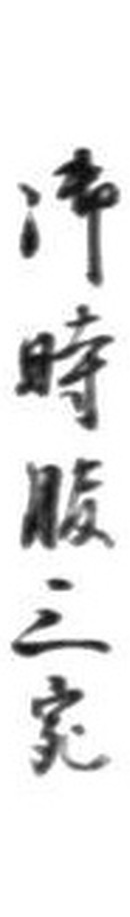重陽御時服三宛
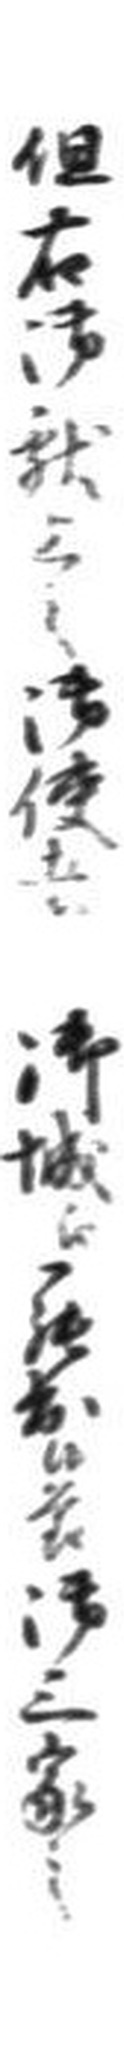但右御献上之御使者御城江罷出候節御三家之

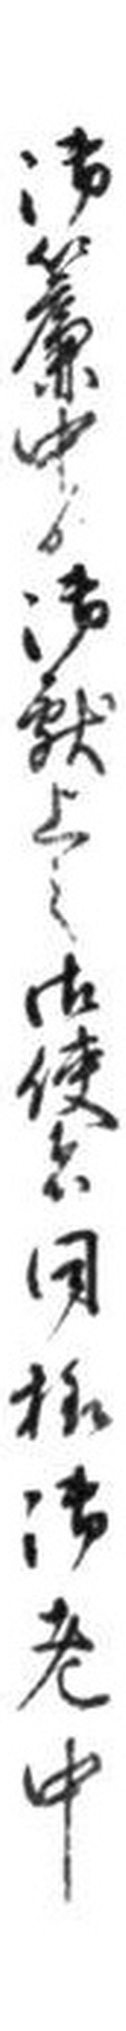御簾中ゟ御献上之御使者同様御老中
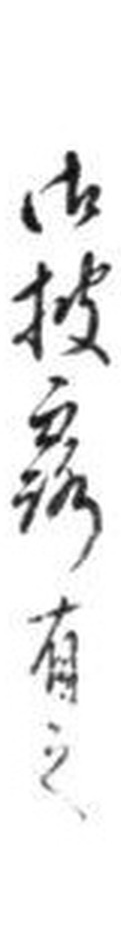御披露有之
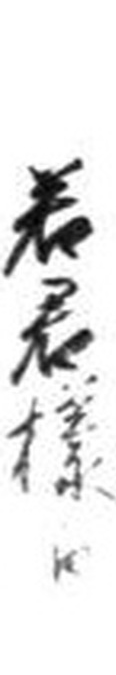若君様江
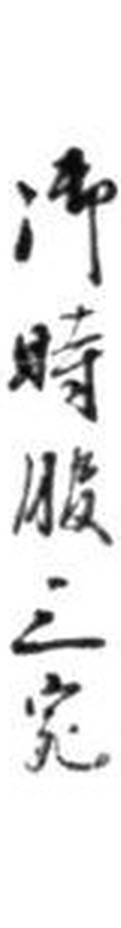重陽御時服三宛
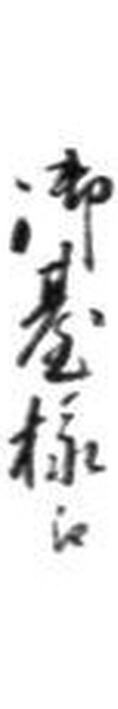御台様江
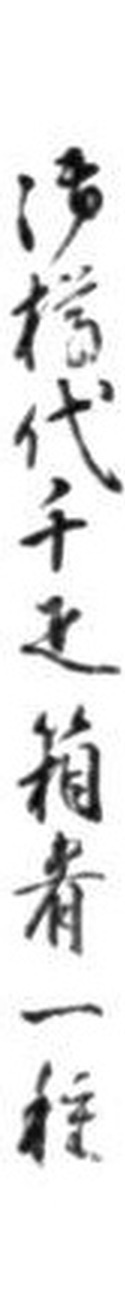歳暮御樽代千疋箱肴一種
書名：家譜 十五 綱昌公 従天和元年到元禄十二年
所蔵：福井県文書館 Fukui Prefectural Archives
